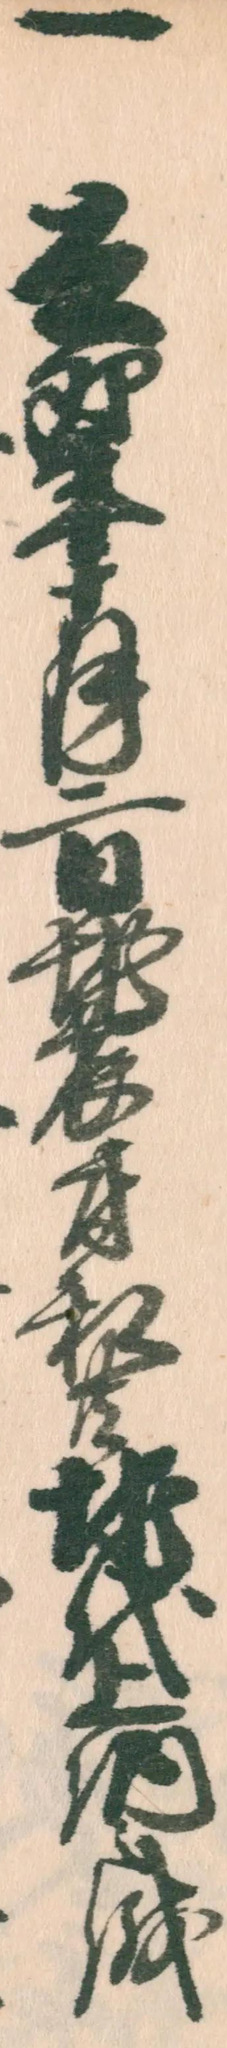一去卯年十月二日地震付私共地代上納之儀
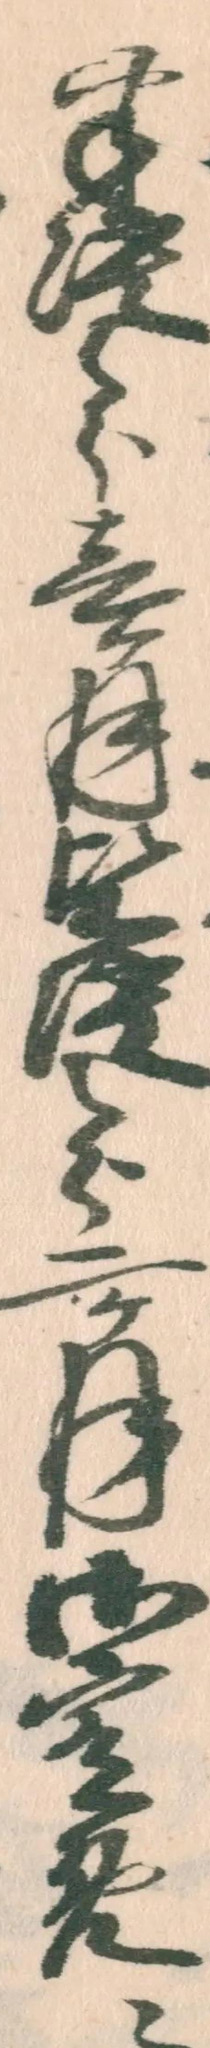半潰之分壱ヶ月皆潰之分二ヶ月御宥免ニ
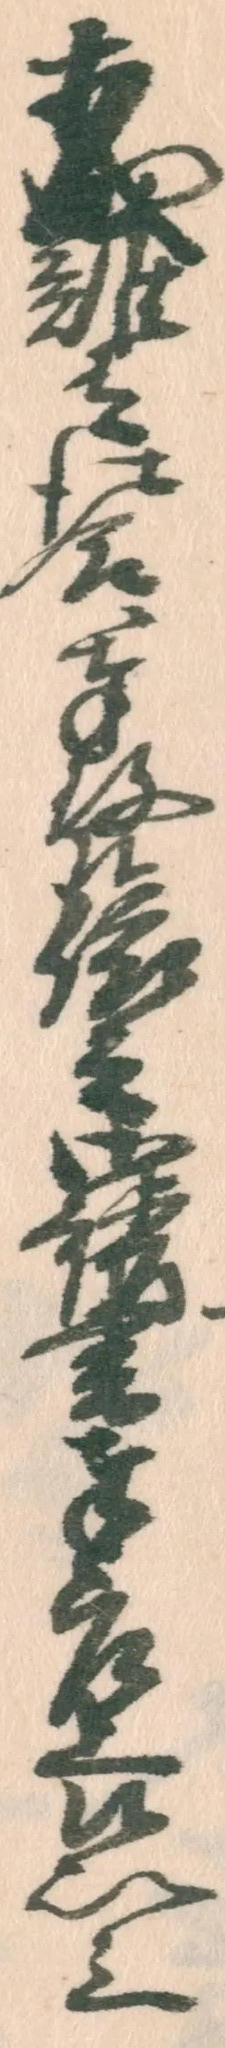相成難有仕合ニ奉存候依之御請書奉差上候以上
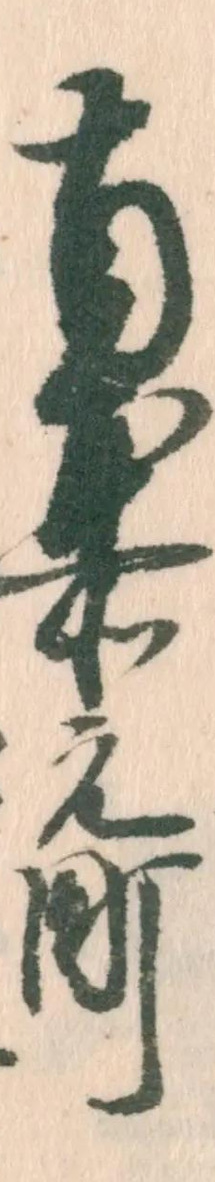南本所元町
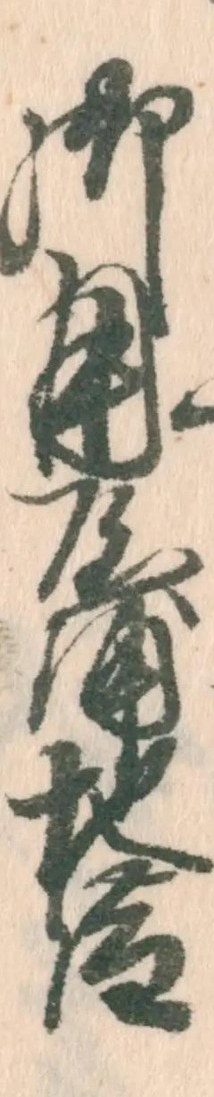御用屋鋪地借

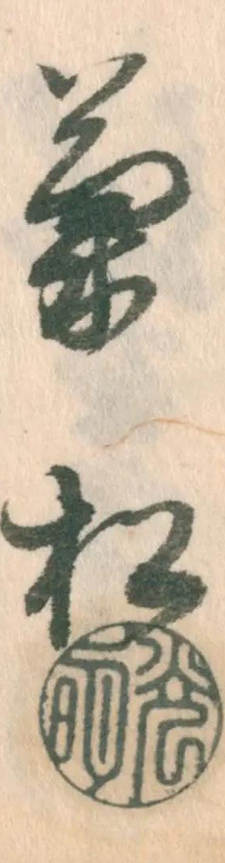菊松(印)
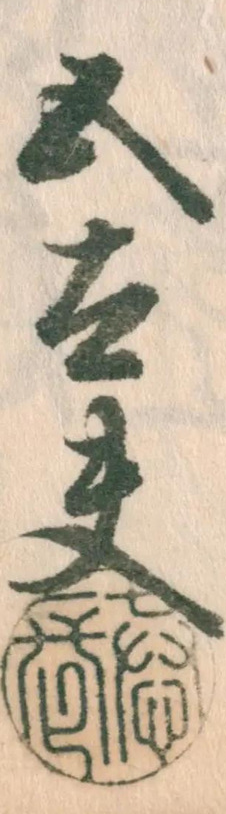五太夫(印)
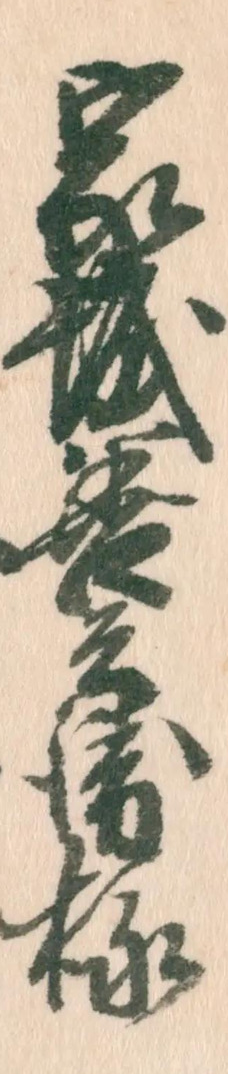家城善兵衛様
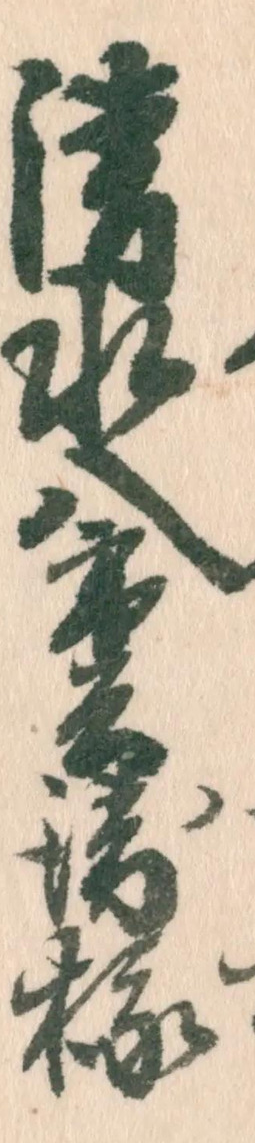清水八郎兵衛様

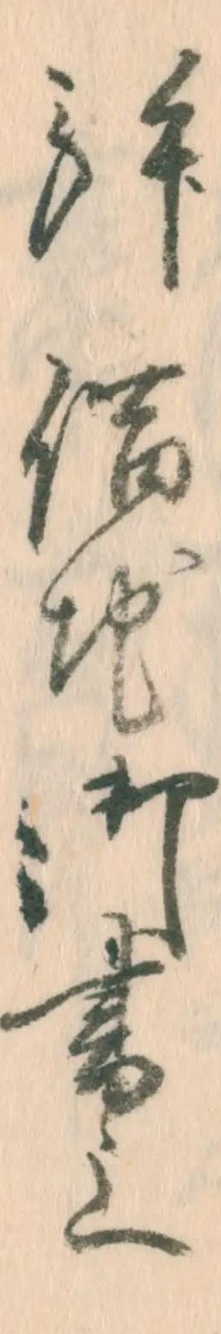拝借地御書上
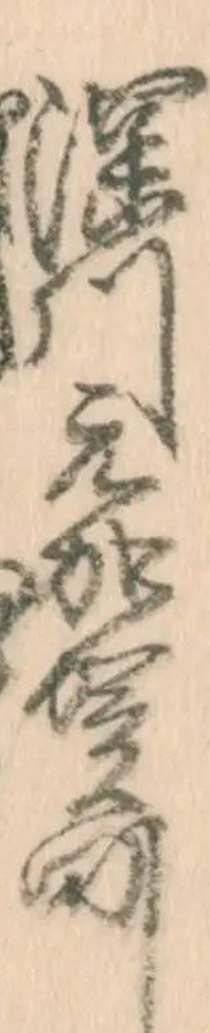深川元加賀町
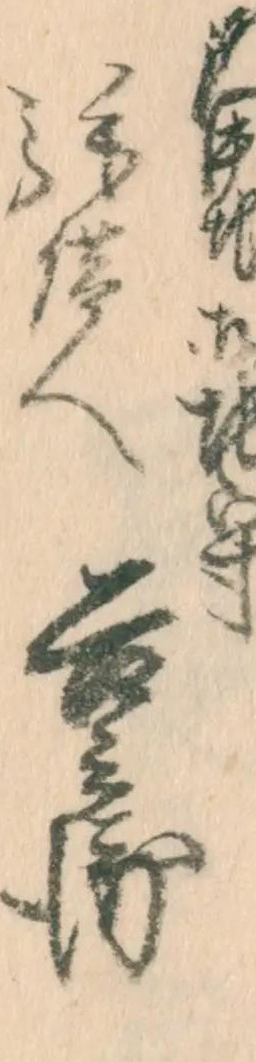拝借人吉兵衛

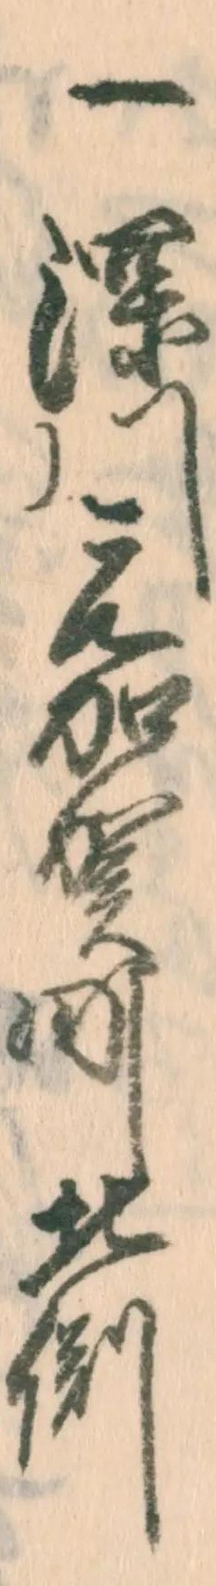一深川元加賀町北側
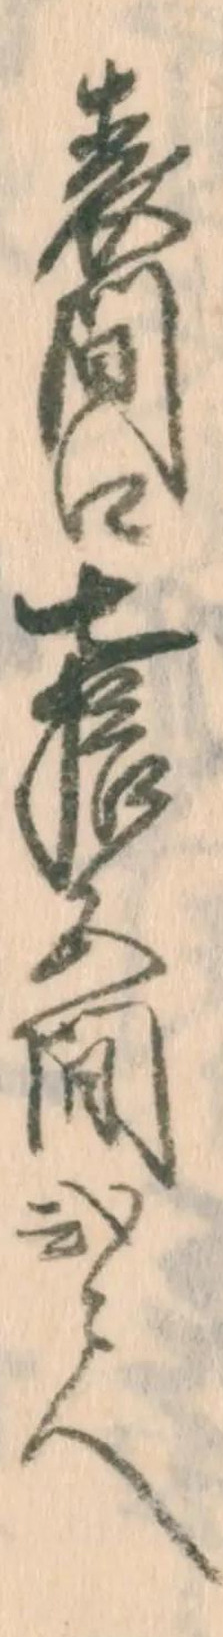表間口七拾五間弐尺
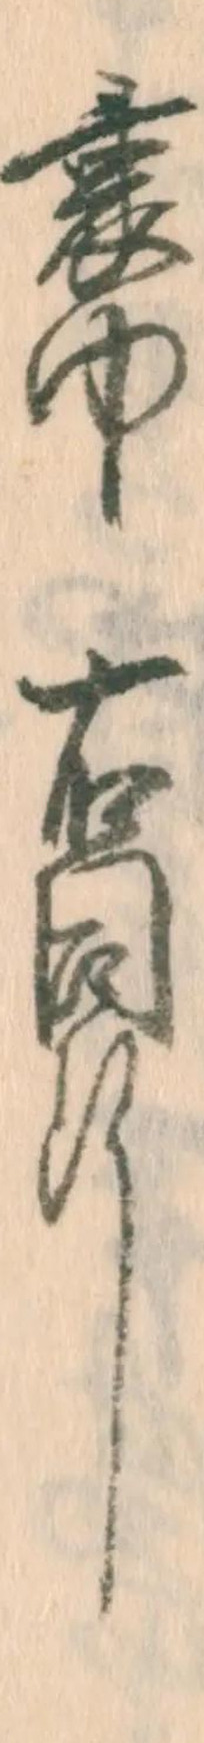裏巾右同断
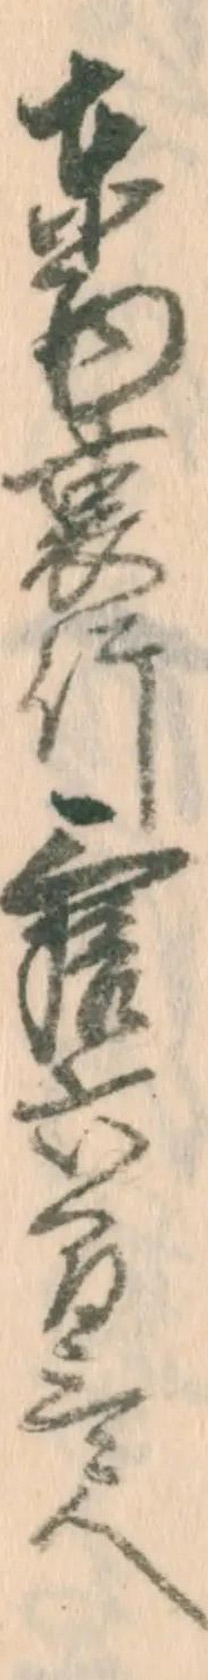東西裏行三拾六間三尺
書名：地震災書留 2巻. [1] 内表紙に「地震災書留　安政二卯年　但本所深川御用屋敷地代免除調」とあり
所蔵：国立国会図書館 National Diet Library, JAPAN
